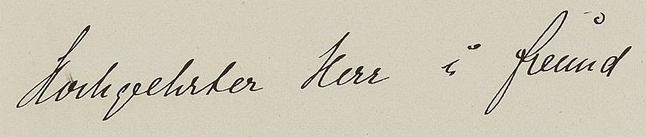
Hochgeehrter Herr u Freund
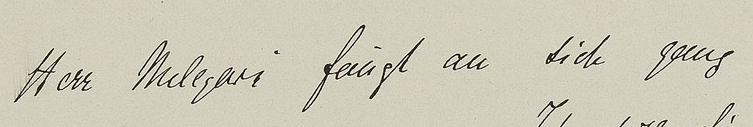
Herr Melegari fängt an sich ganz
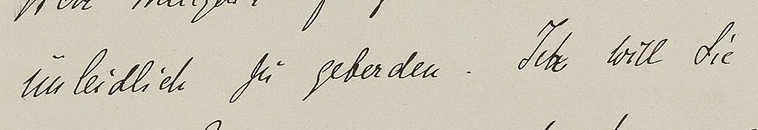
unleidlich zu geberden. Ich will Sie
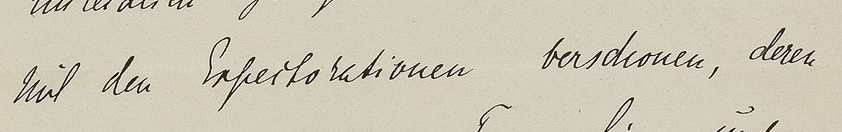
mit den Expectorationen verschonen, deren
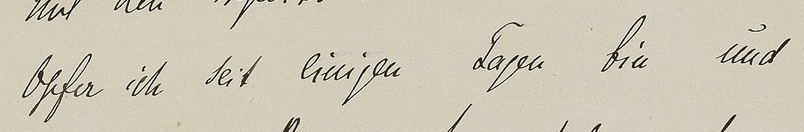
Opfer ich seit einigen Tagen bin und
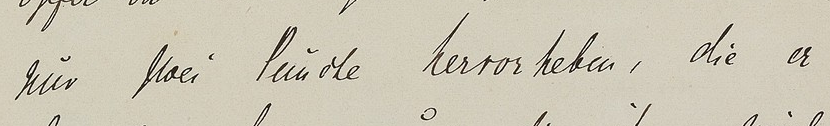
nur zwei Puncte hervorheben, die er
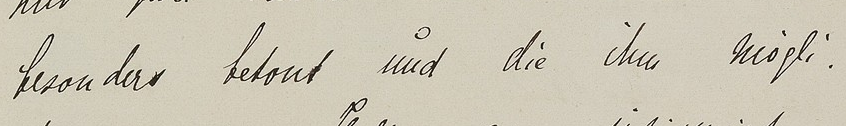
besonders betont und die ihm mögli-
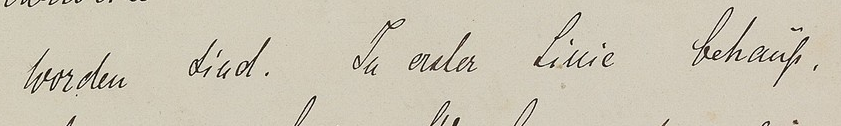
worden sind. In erster Linie behaup-
